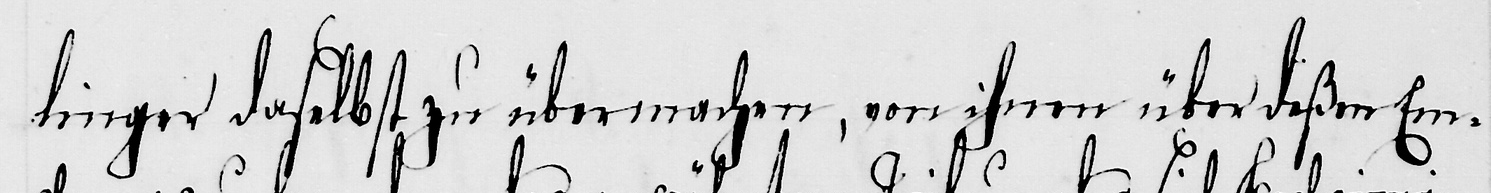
linger daselbst zu übermachen, von ihnen über deßen Em¬
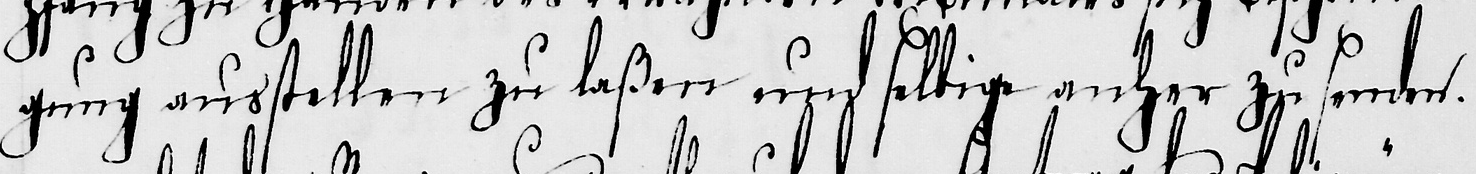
gung ausstellen zu laßen und selbige anher zu senden.
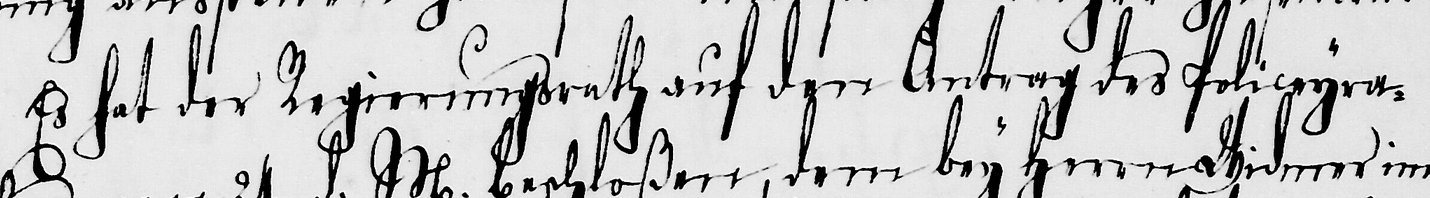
Es hat der Regierungsrath auf den Antrag des Policeyra¬
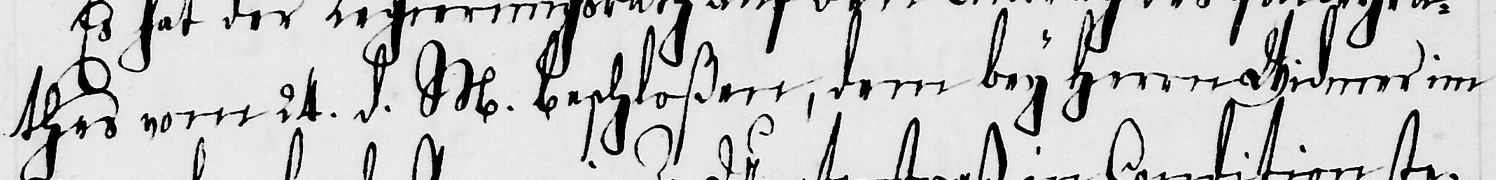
thes vom 24. d. M. beschloßen, dem bey Herrn Widmer im
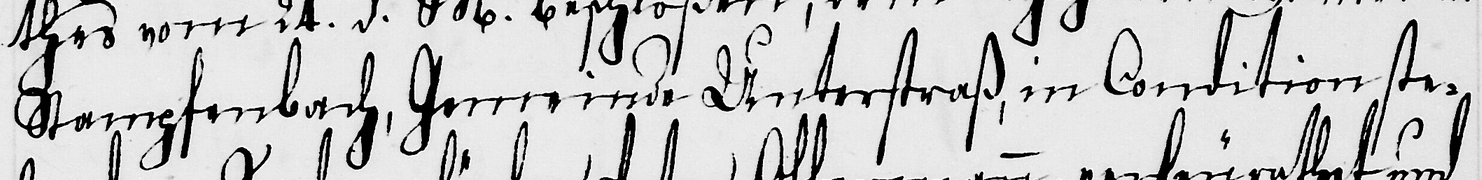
Stampfenbach, Gemeinde Unterstraß, in Condition ste¬
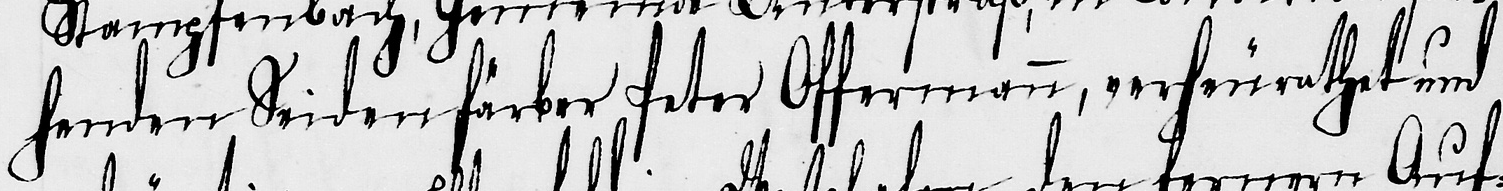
henden Seidenfärber Peter Offermann, verheurathet und
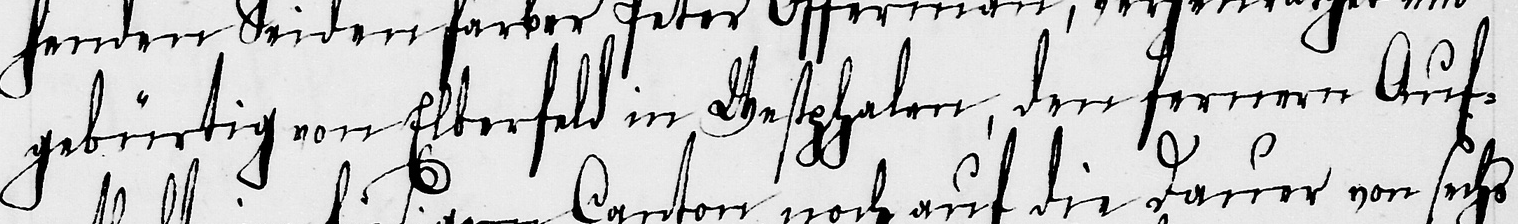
gebürtig von Elbersfeld in Westphalen, den ferneren Auf¬
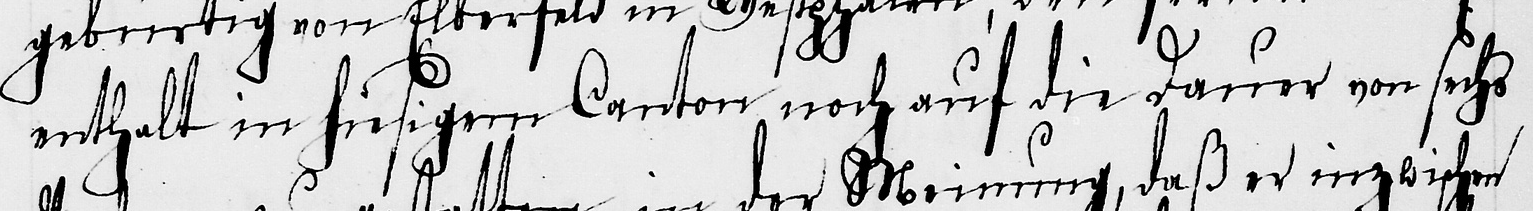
enthalt in hiesigem Canton noch auf die Dauer von sechs
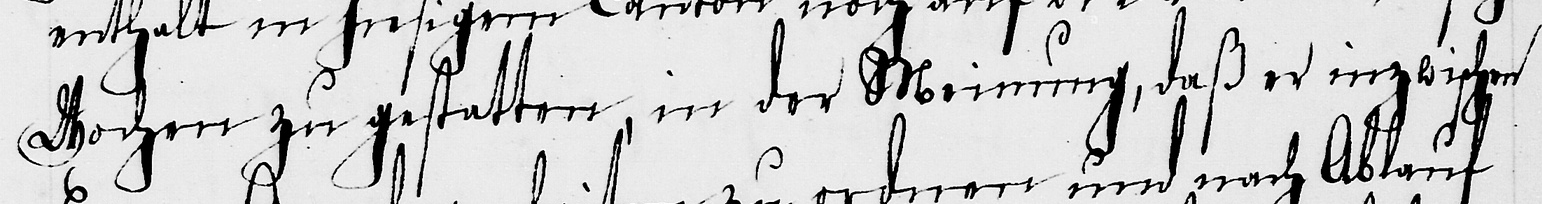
Wochen zu gestatten, in der Meinung, daß er inzwischen
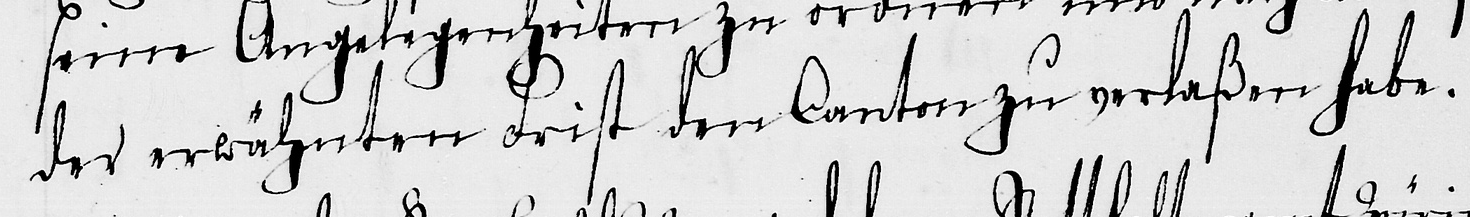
der erwähnten Frist den Canton zu verlaßen habe.
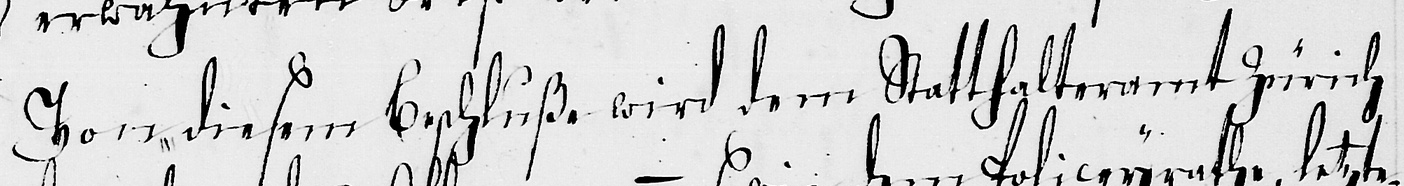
Von diesem Beschluße wird dem Statthalteramt Zürich
